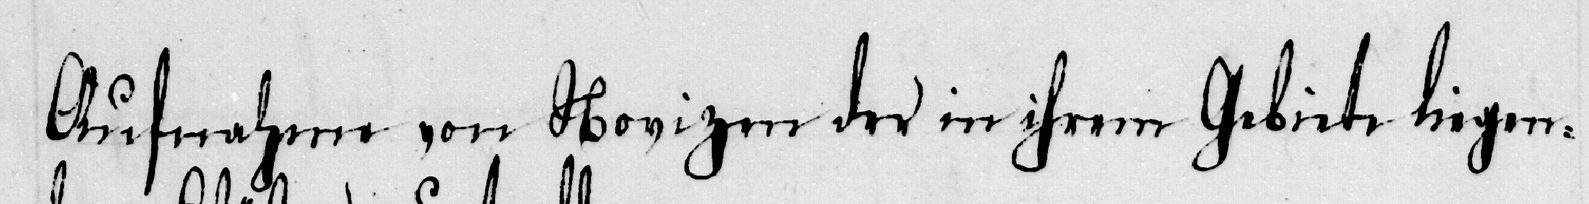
Aufnahme von Novizen der in ihrem Gebiete liegen¬
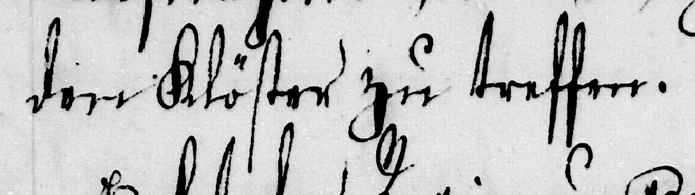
den Klöster zu treffen.
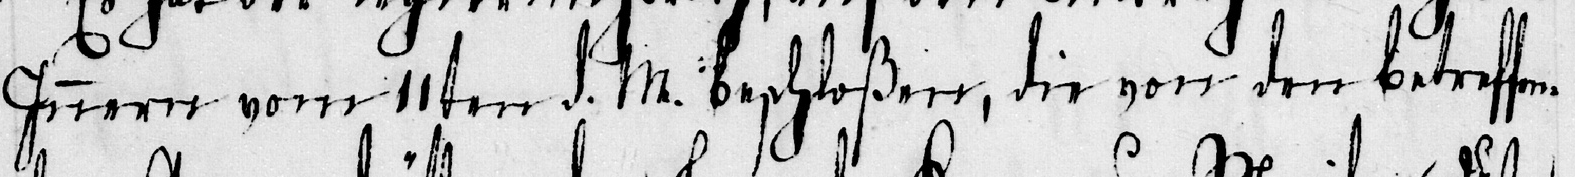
Innern vom 11ten d. M. beschloßen, die von den betreffe¬
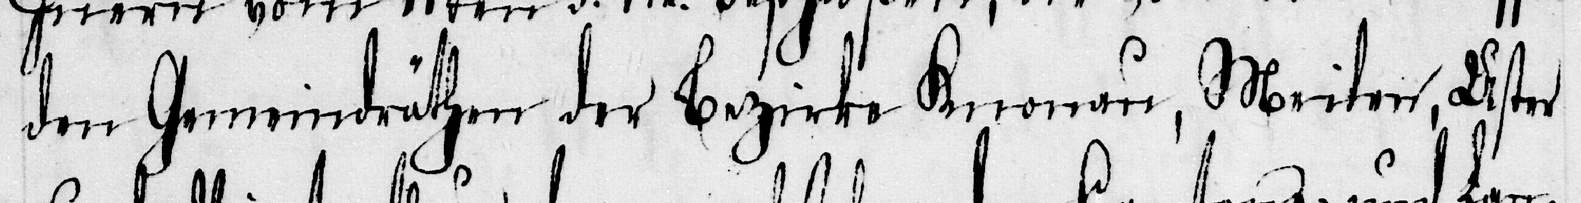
nden Gemeindräthen der Bezirke Knonau, Meilen, Uster
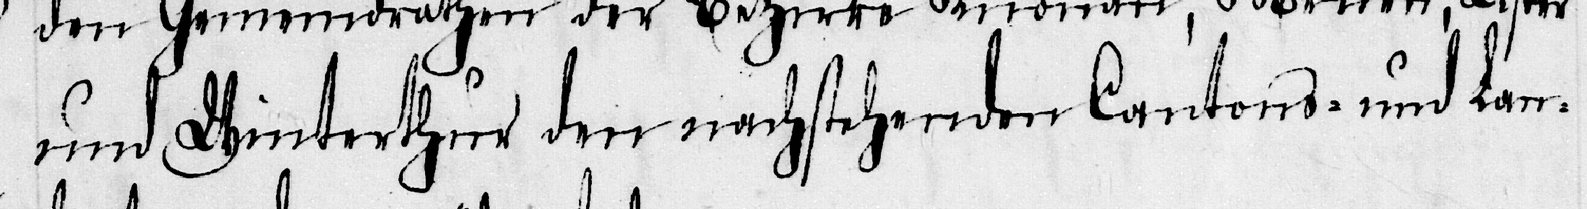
und Winterthur den nachstehenden Cantons- und Lan¬
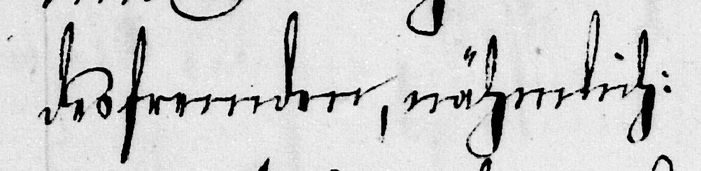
desfremden, nähmlich:
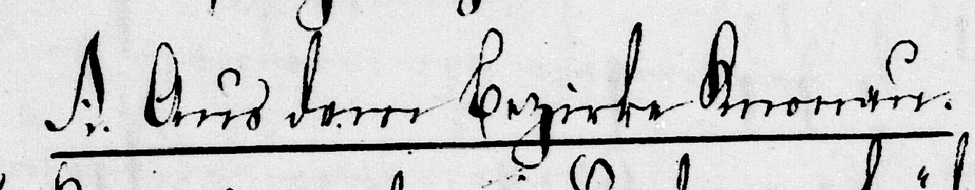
A. Aus dem Bezirke Knonau.
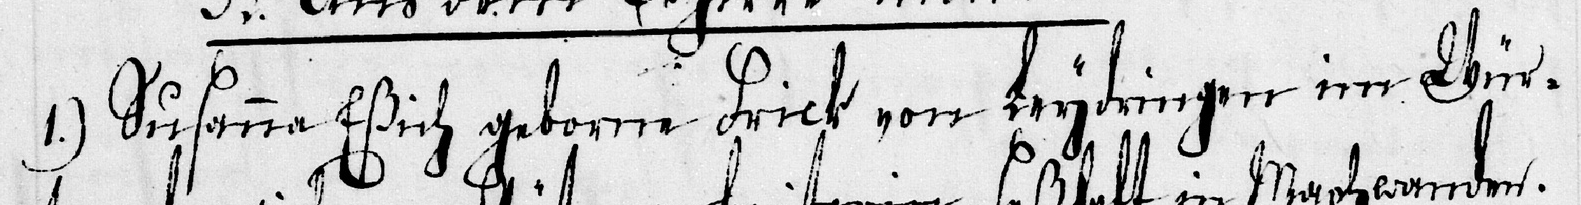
1.) Susanna Eßich geborne Frick von Leydringen im Wür¬
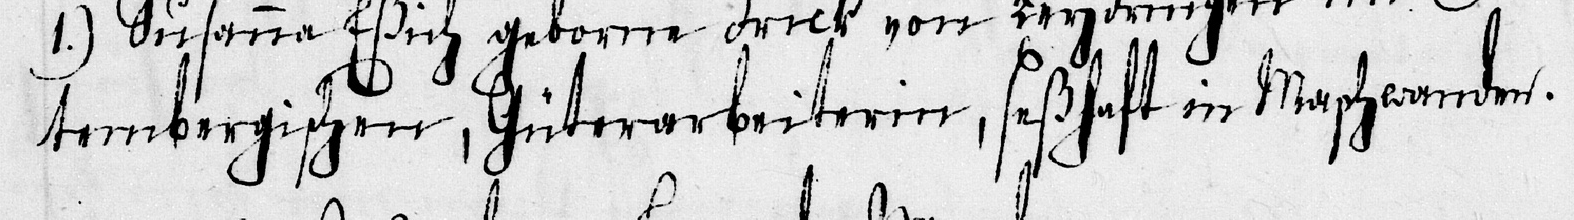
tembergischen, Güterarbeiterin, seßhaft in Maschwanden.
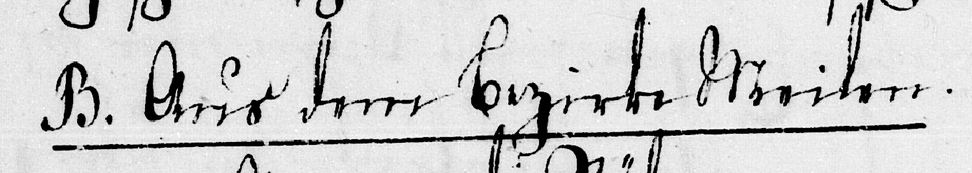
B. Aus dem Bezirke Meilen.
